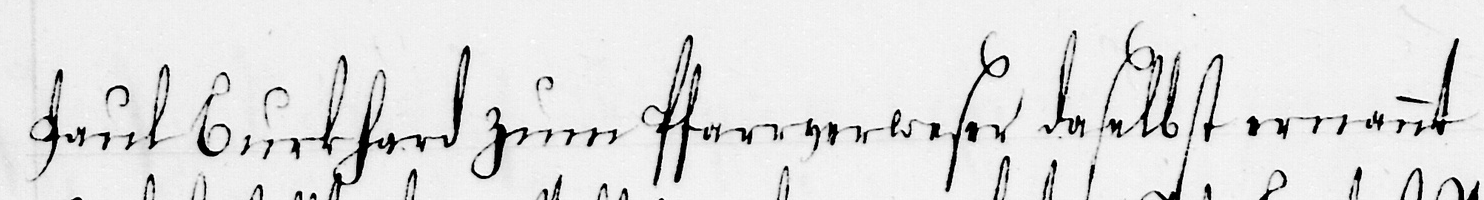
Paul Burkhard zum Pfarrverweser daselbst ernannt
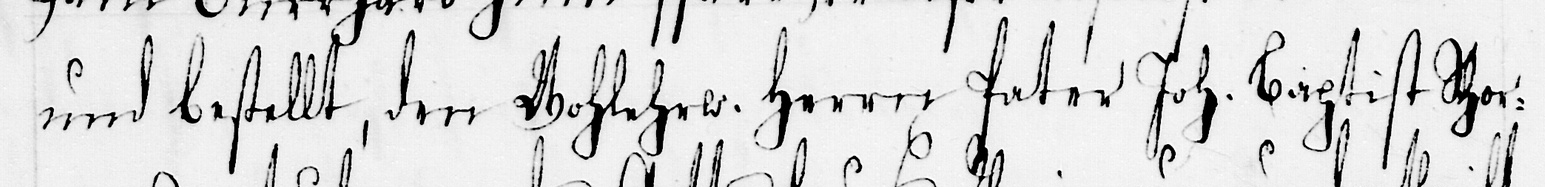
und bestellt, den Wohlehrw. Herrn Pater Joh. Baptist Scho¬
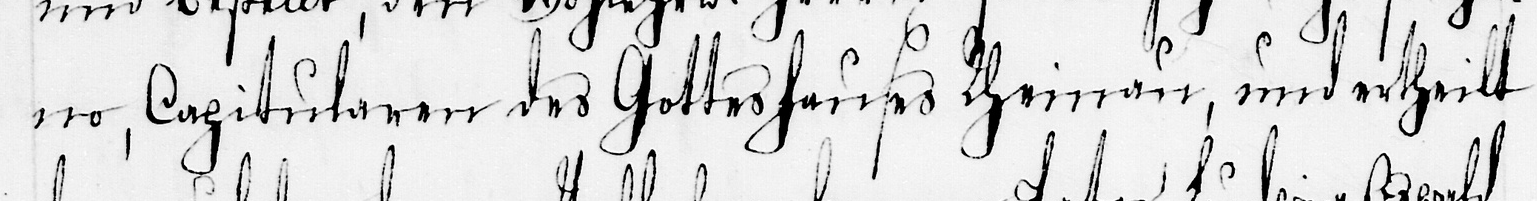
no, Capitularen des Gotteshauses Rheinau, und ertheilt
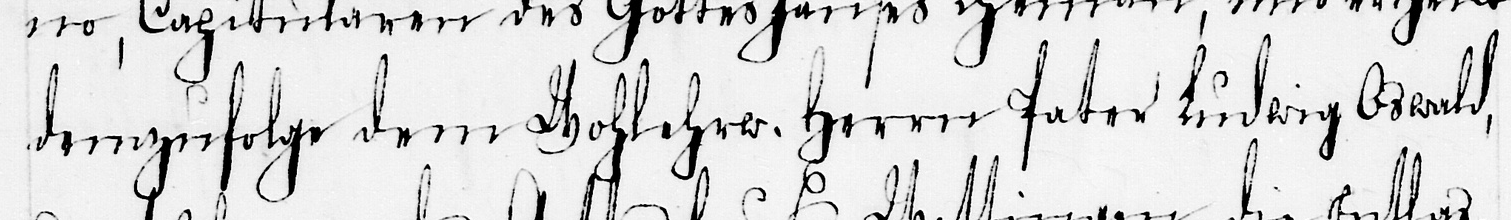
demzufolge dem Wohlehrw. Herrn Pater Ludwig Oswald,
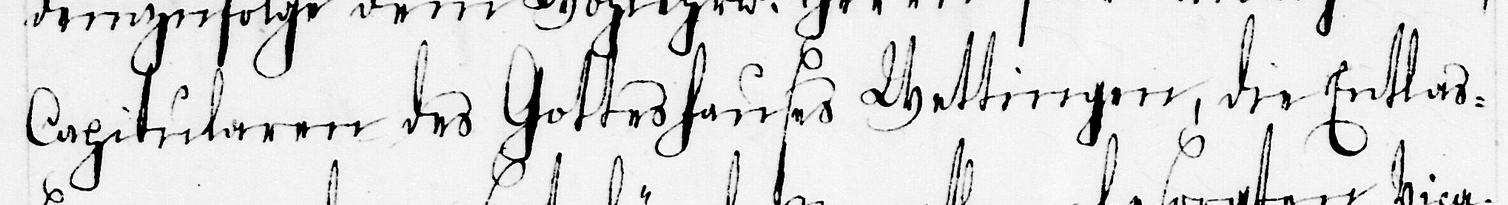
Capitularen des Gotteshauses Wettingen, die Entla¬
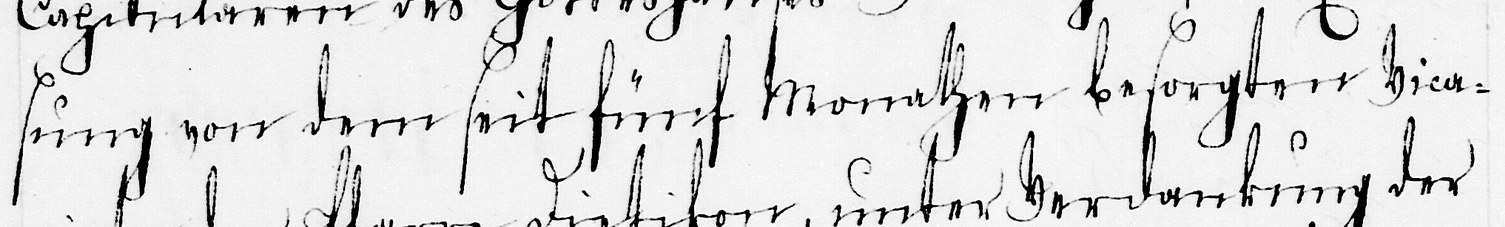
ßung von dem seit fünf Monathen besorgten Vica¬
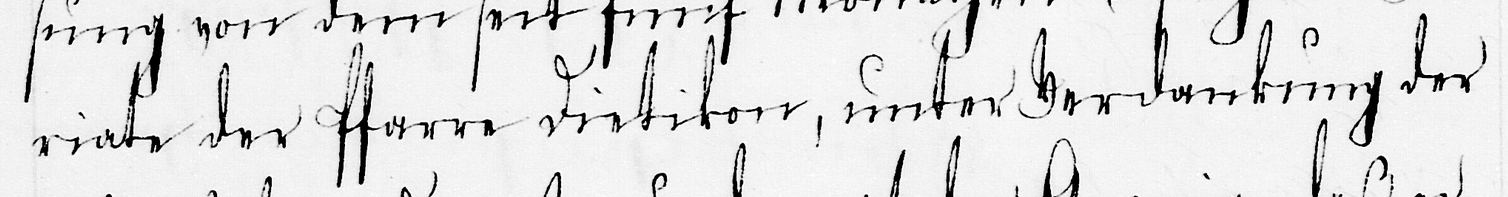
riate der Pfarre Dietikon, unter Verdankung der
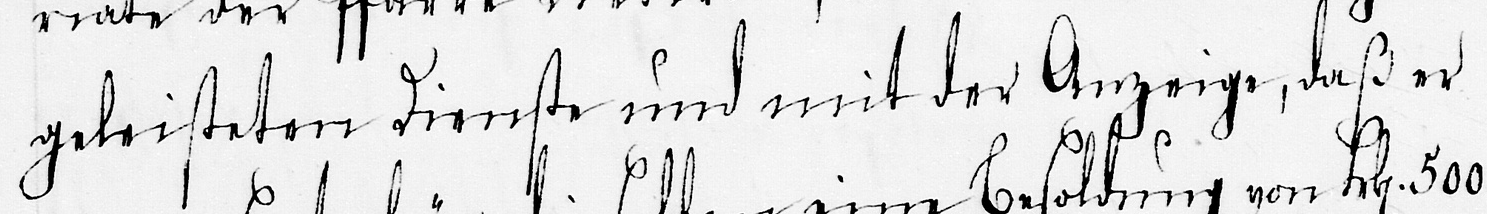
geleisteten Dienste und mit der Anzeige, daß er
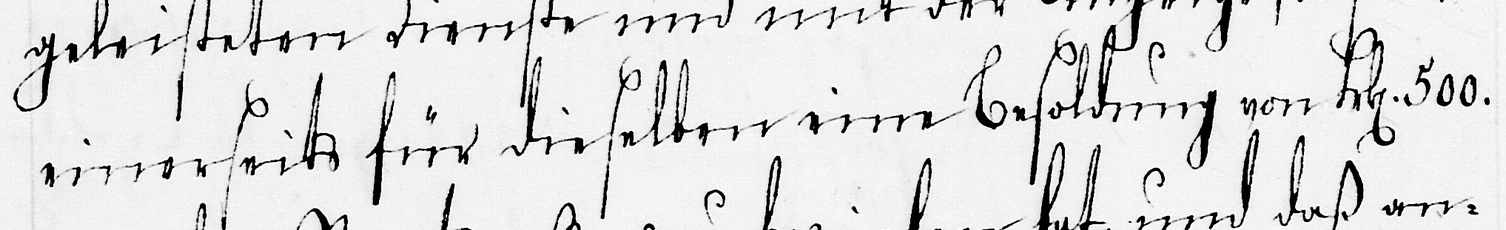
einerseits für dieselben eine Besoldung von Frk[en].
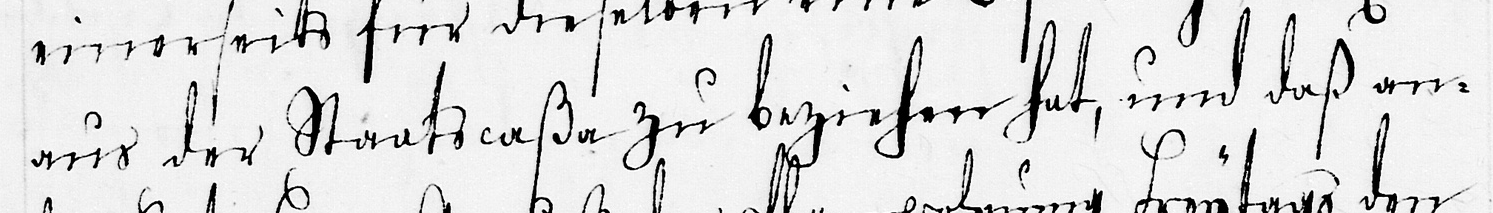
aus der Staatscaßa zu beziehen hat, und daß an¬
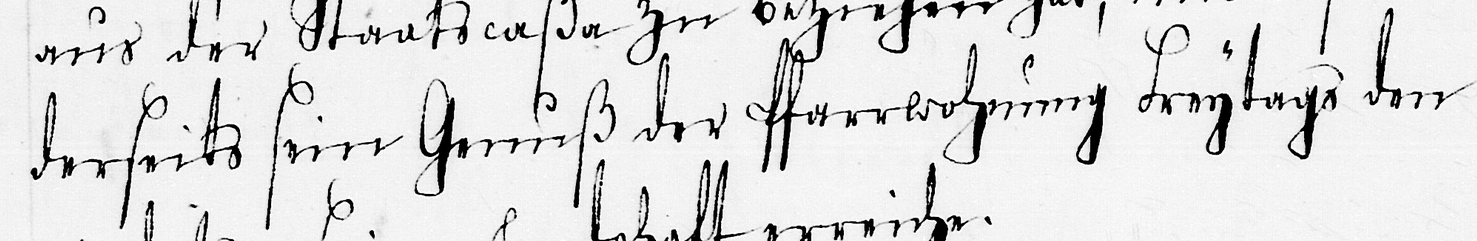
derseits sein Genuß der Pfarrwohnung Freytags den
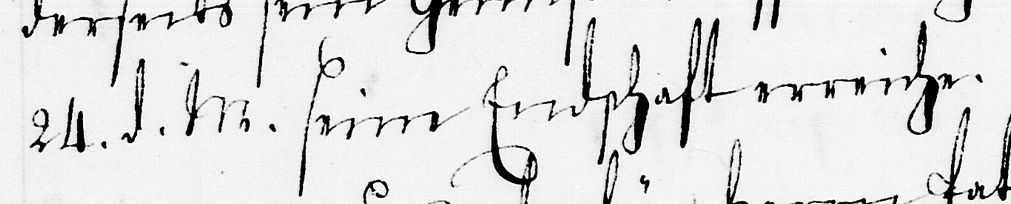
24. d. M. seine Endschaft erreiche.
